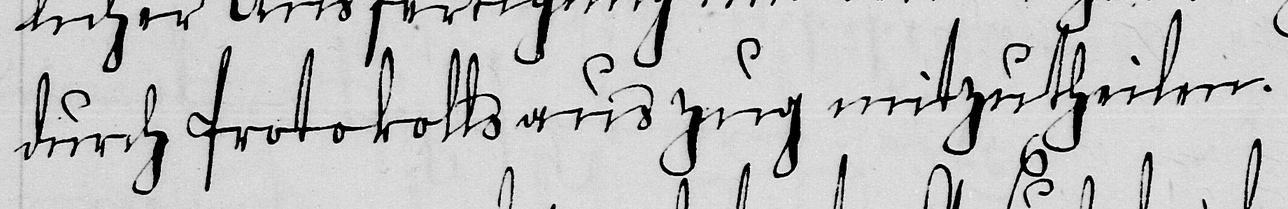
durch Protokollsauszug mitzutheilen.
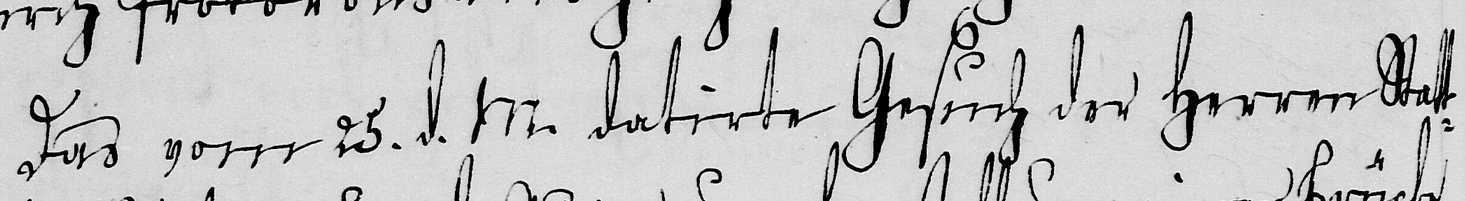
Das vom 25. d. M. datirte Gesuch der Herren Sta¬
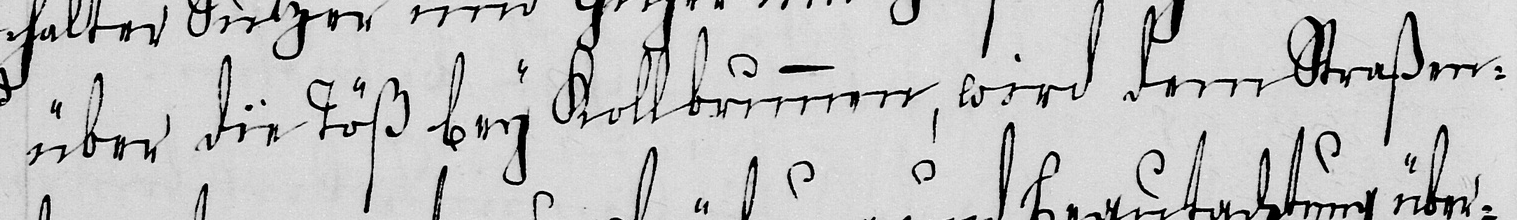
über die Töß bey Kollbrunnen, wird dem Straßen¬
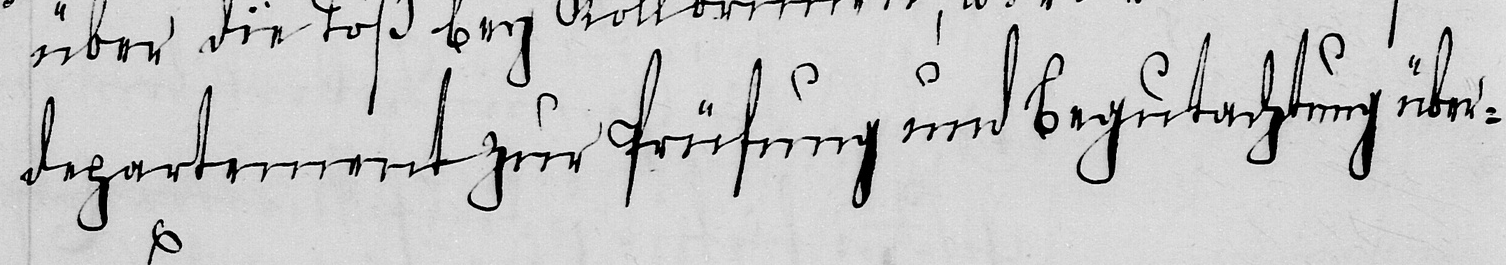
departement zur Prüfung und Begutachtung übe¬
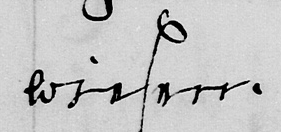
rwiesen.
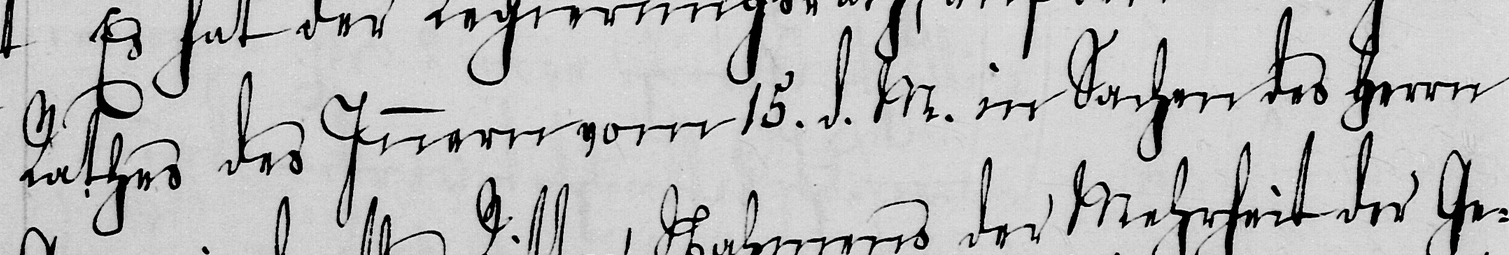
Rathes des Innern vom 15. d. M. in Sachen des Herrn
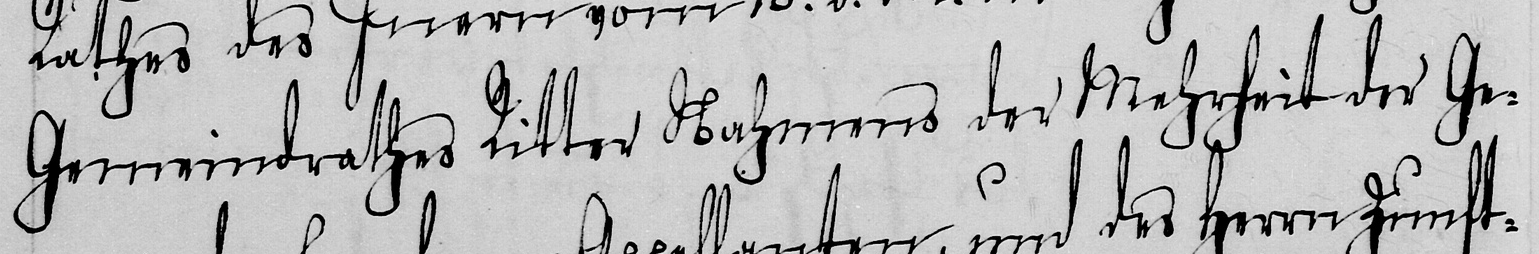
Gemeindrathes Ritter Nahmens der Mehrheit der Ge¬
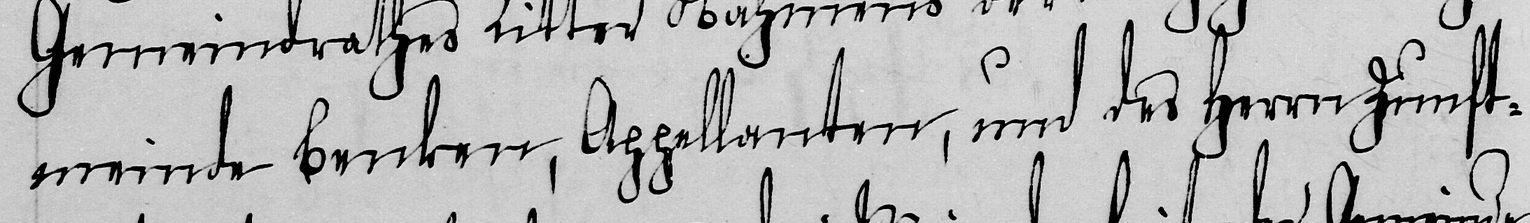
meinde Benken, Appellanten, und des Herrn Zunft¬
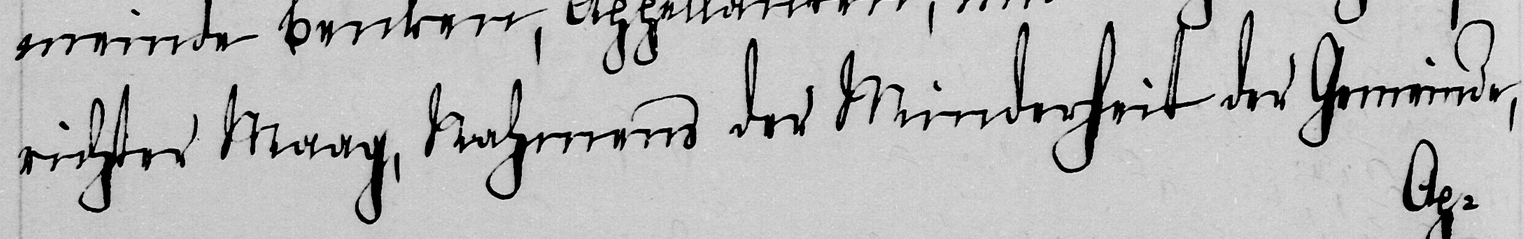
richter Maag, Nahmens der Minderheit der Gemeinde,
